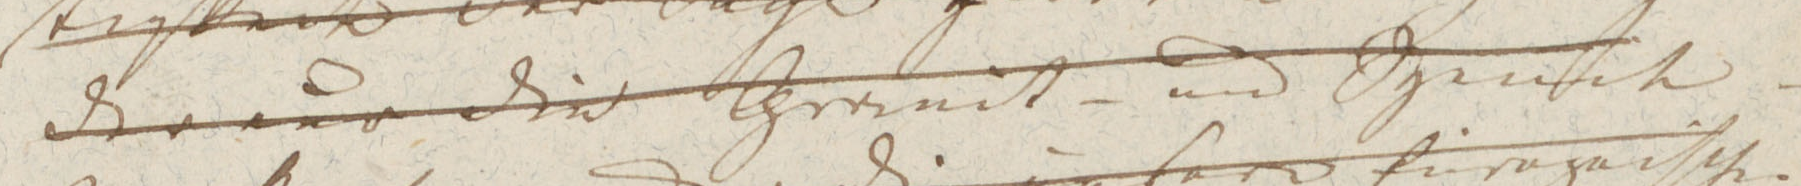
der nur die Granit- und Syenit
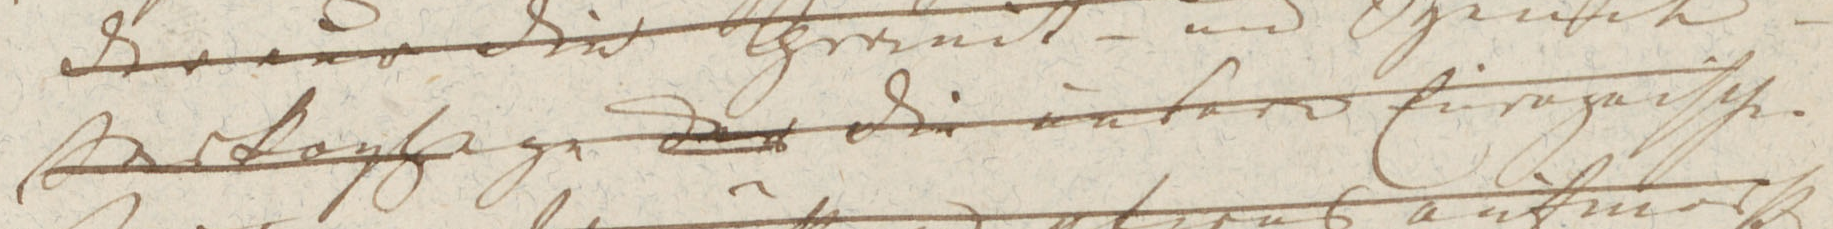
Sarkophage der die unsere Europaische
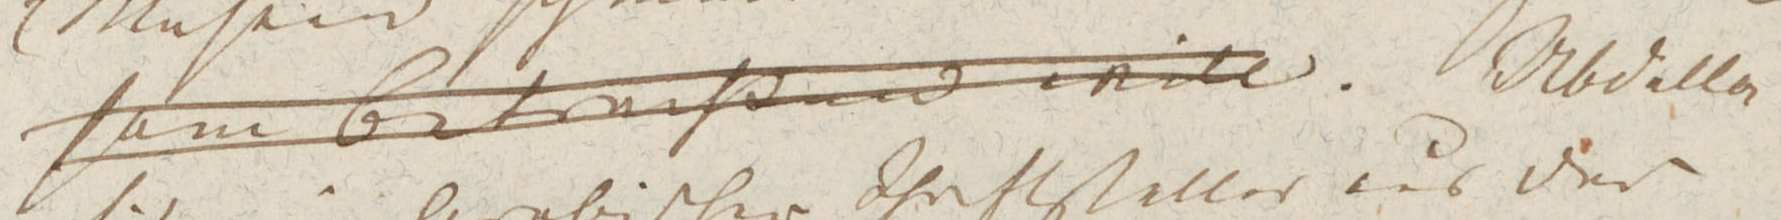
sam betrachten will. Abdalla-
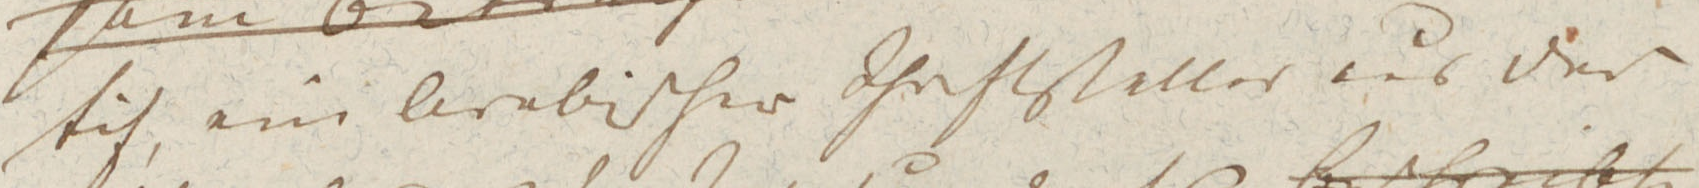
tif, ein Arabischer Schriftsteller aus der
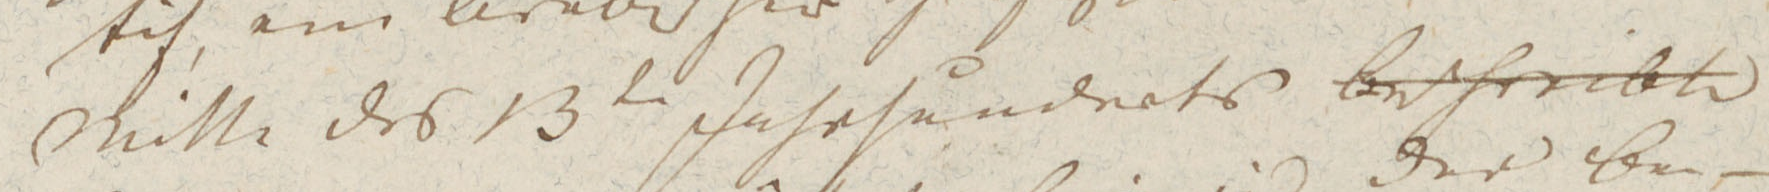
Mitte des 13te Jahrhunderts beschreibt
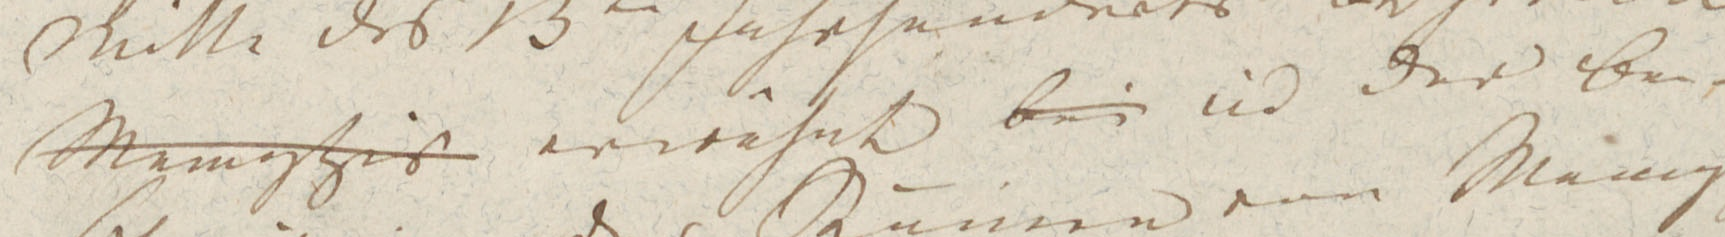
Memphis erwähnt bei in der Be-
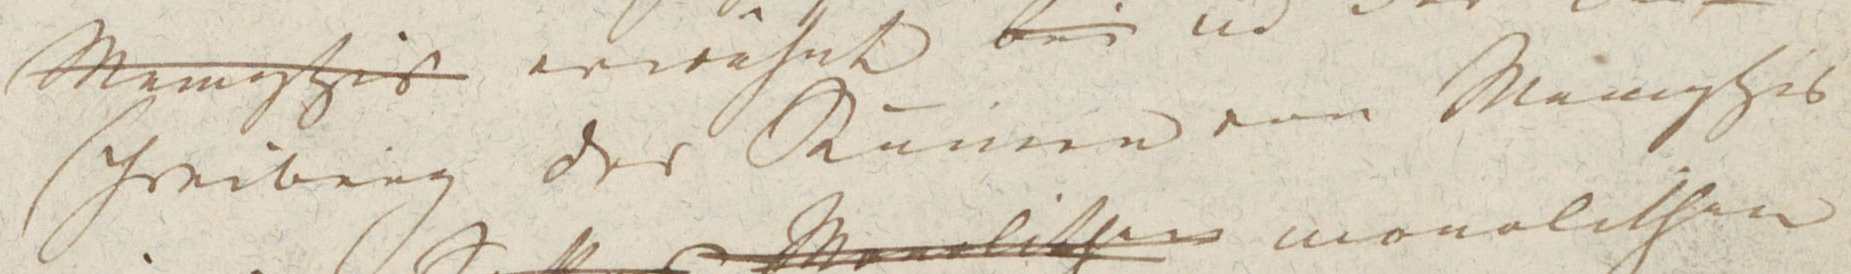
schreibung der Ruinen von Memphis
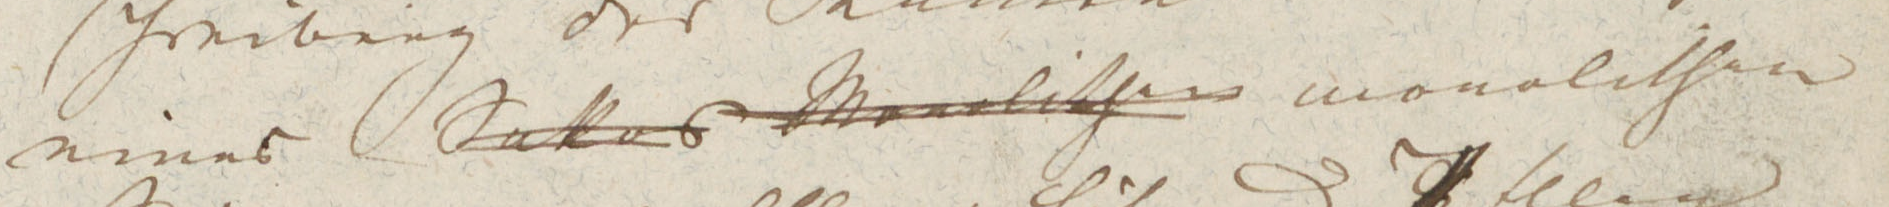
eines Sekos Monolithen monolithen
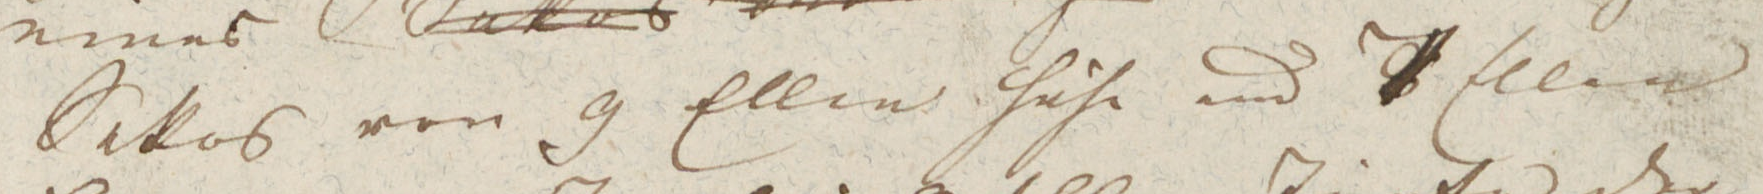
Sekos von 9 Ellen Höhe und 87 Ellen
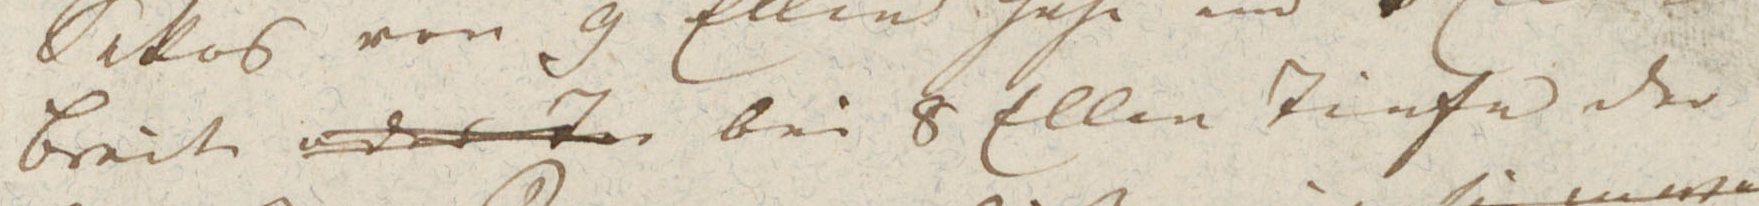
Breite oder Tie bei 8 Ellen Tiefe der
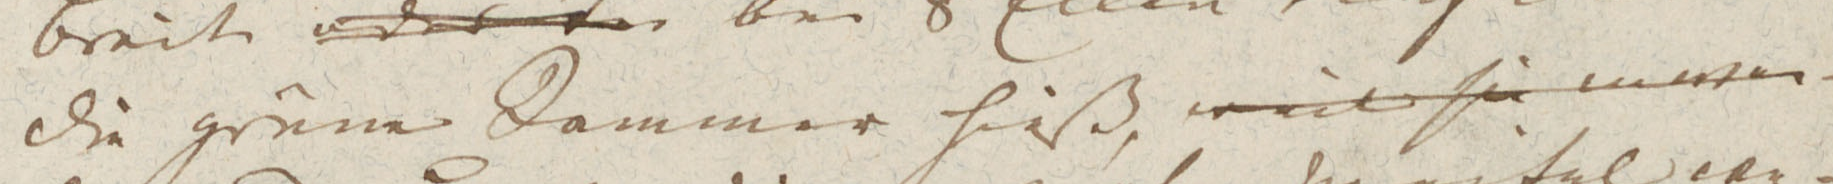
die grüne Kammer hiess, weil sie inwen-
